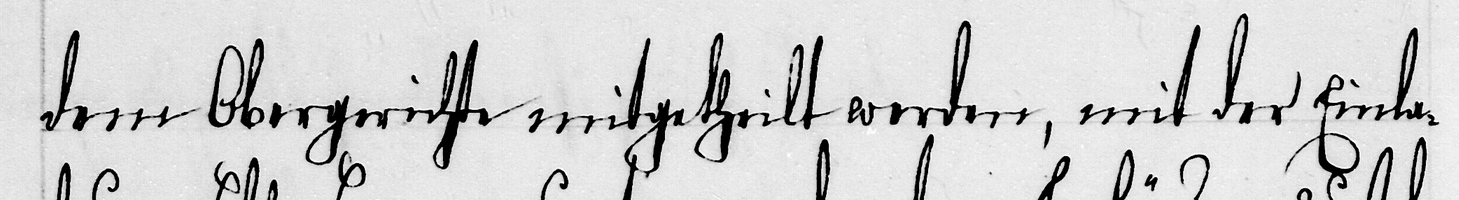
dem Obergerichte mitgetheilt werden, mit der Einla¬
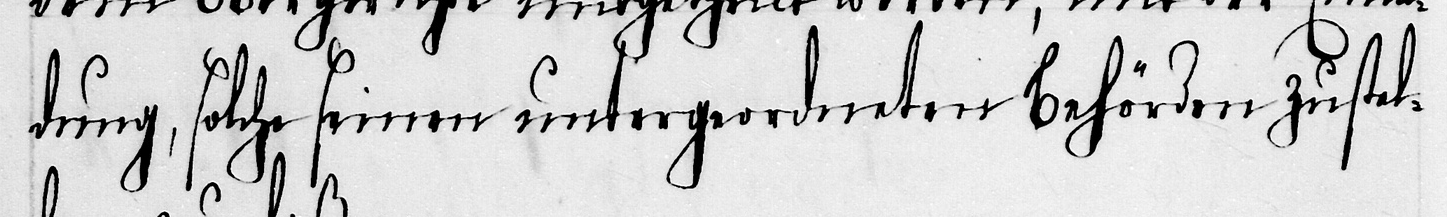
dung, solche seinen untergeordneten Behörden zustel¬
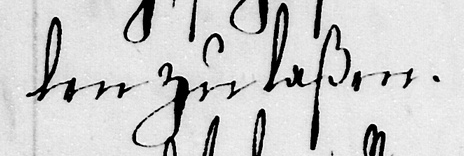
len zu laßen.
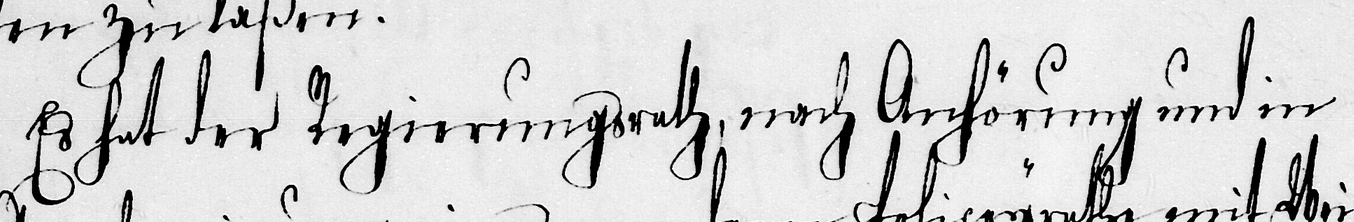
Es hat der Regierungsrath, nach Anhörung und in
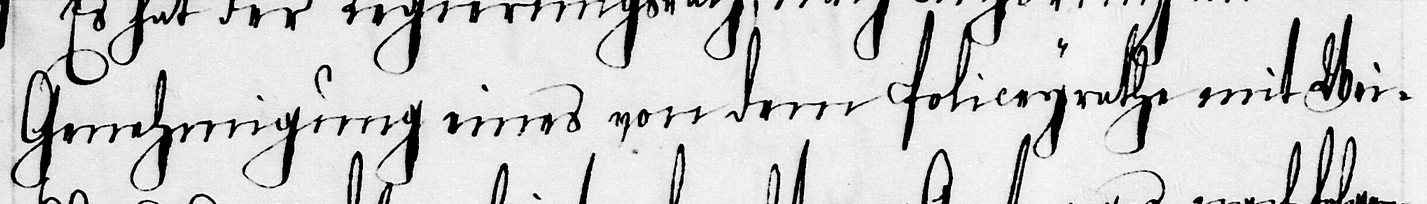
Genehmigung eines von dem Policeyrathe mit Weis¬
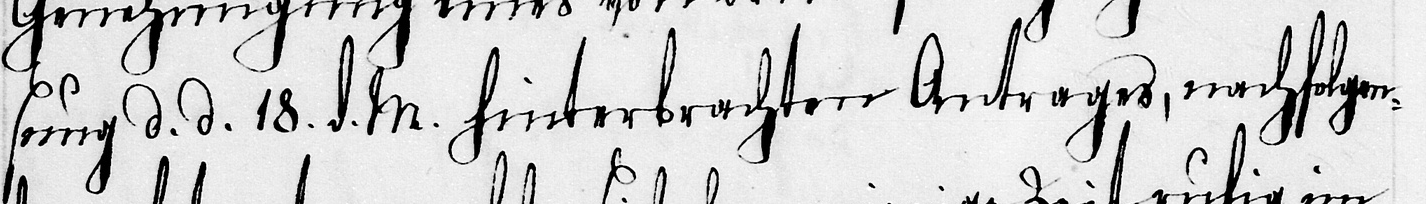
ung d. d. 18. d. M. hinterbrachten Antrages, nachfolge¬
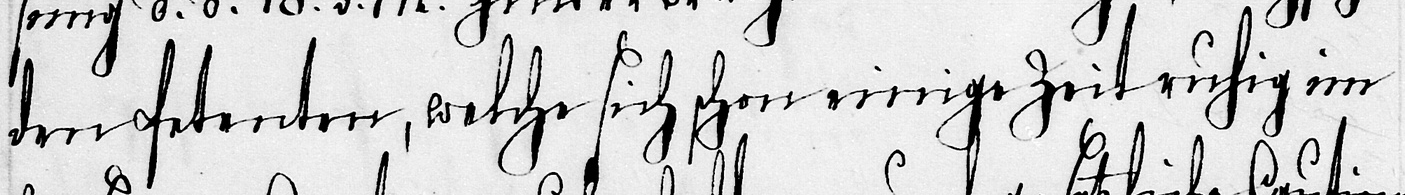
nden Petenten, welche sich schon einige Zeit ruhig im
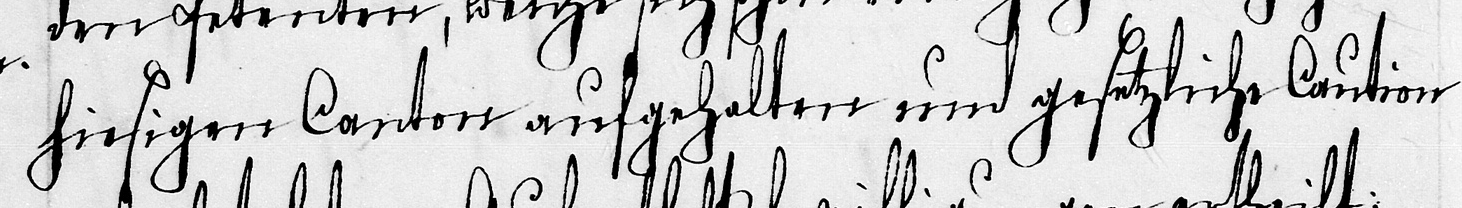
hiesigen Canton aufgehalten und gesetzliche Caution
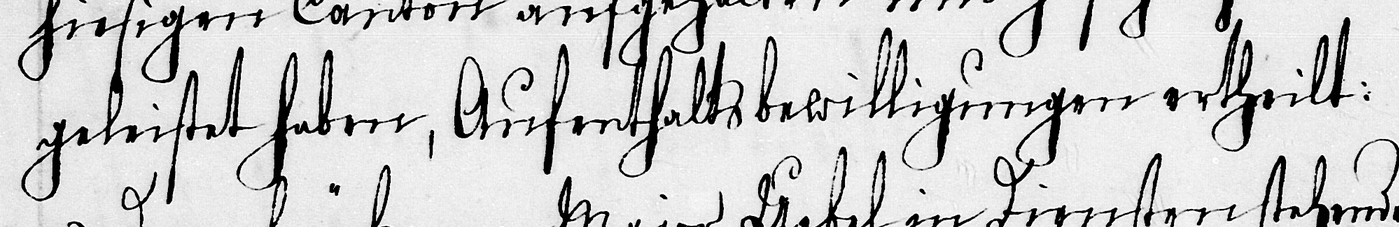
geleistet haben, Aufenthaltsbewilligungen ertheilt:
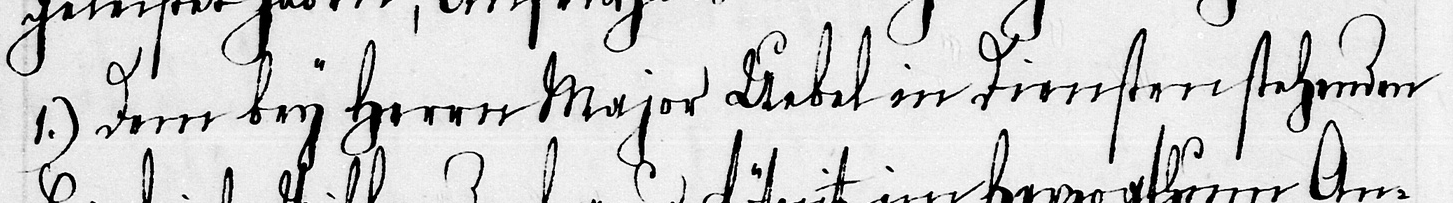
1.) Dem bey Herrn Major Uebel in Diensten stehenden
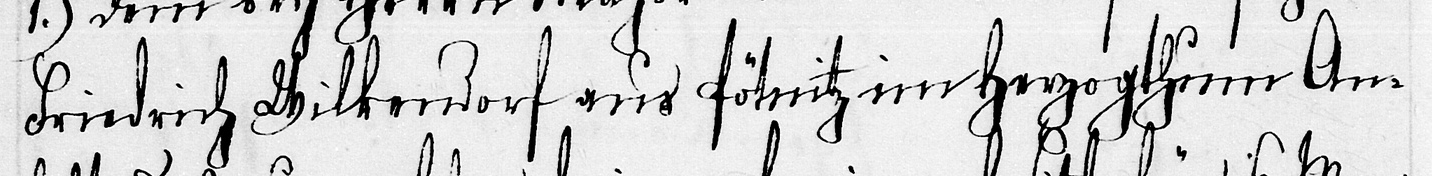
Friedrich Wilkendorf aus Pötnitz im Herzogthum An¬
